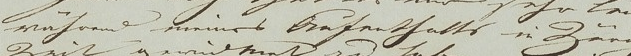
während meines Aufenthalts in Zürich
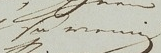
so wenig
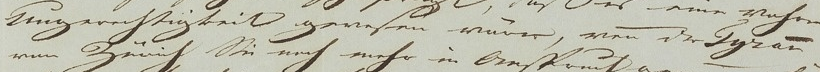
Ungerechtigkeit gewesen wäre, wenn der Tyrann
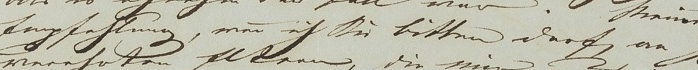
Empfehlungen, wenn ich Sie bitten darf, an
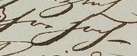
Ihre hoch-
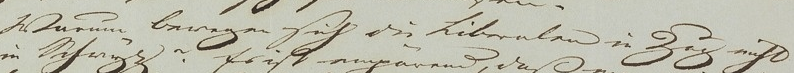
Warum bewegen sich die Liberalen in Zug nicht
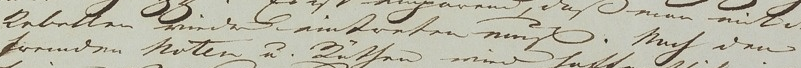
Rebellen wieder eintreten muß. Nach den
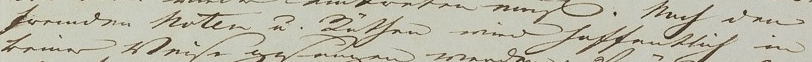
fremden Noten u. Räthen wird hoffentlich in
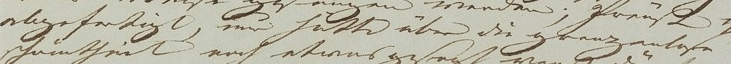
abgefertigt, nur hätte über die grenzenlose
